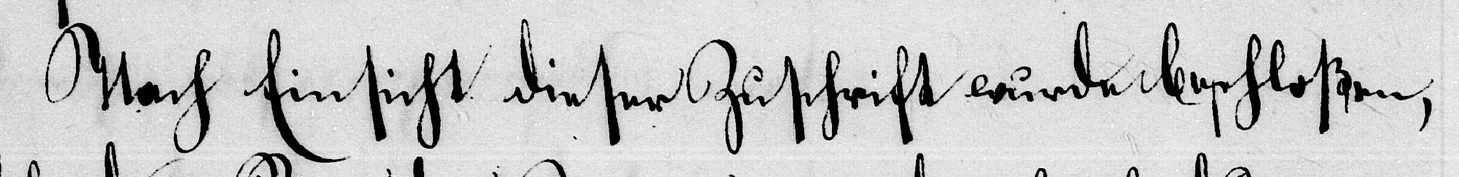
Nach Einsicht dieser Zuschrift wurde beschloßen,
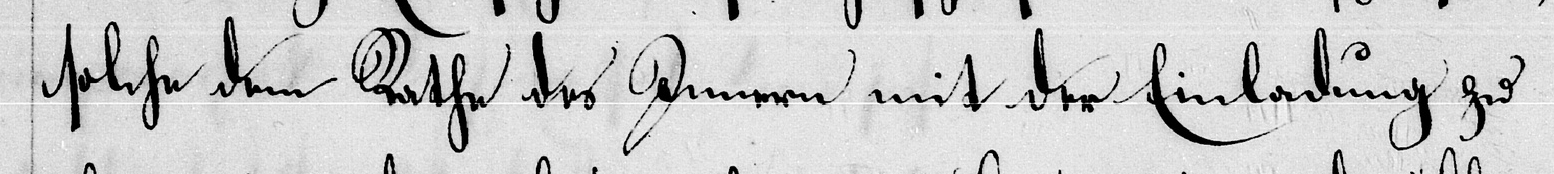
solche dem Rathe des Innern mit der Einladung zu
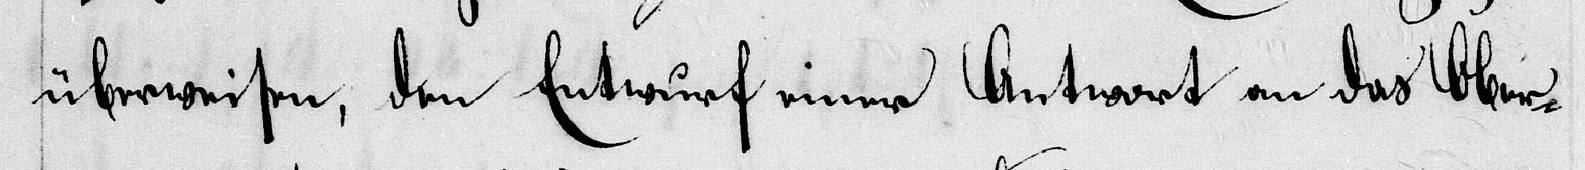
überweisen, den Entwurf einer Antwort an das Ober¬
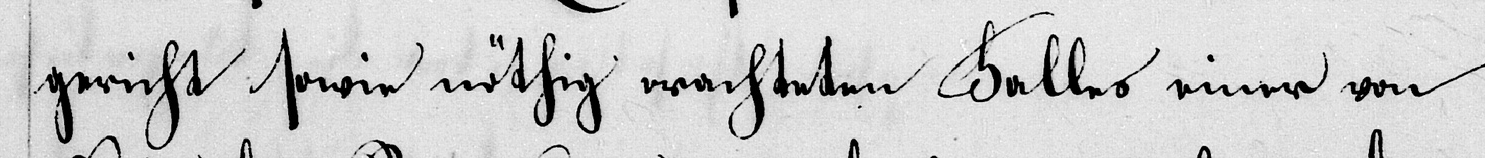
gericht sowie nöthig erachteten Falles einen von
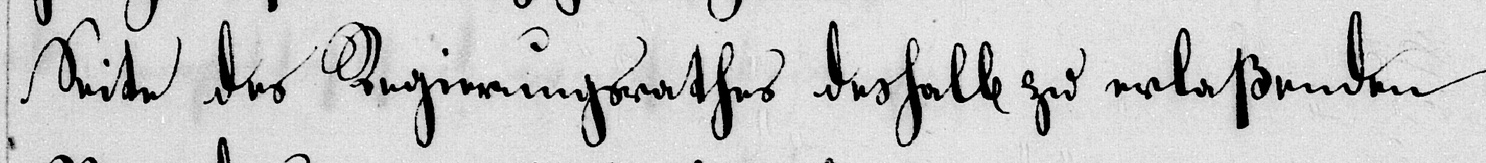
Seite des Regierungsrathes deshalb zu erlaßenden
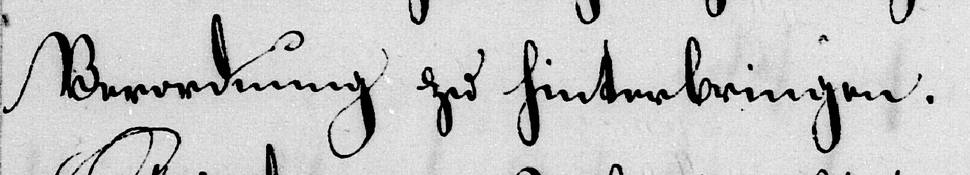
Verordnung zu hinterbringen.
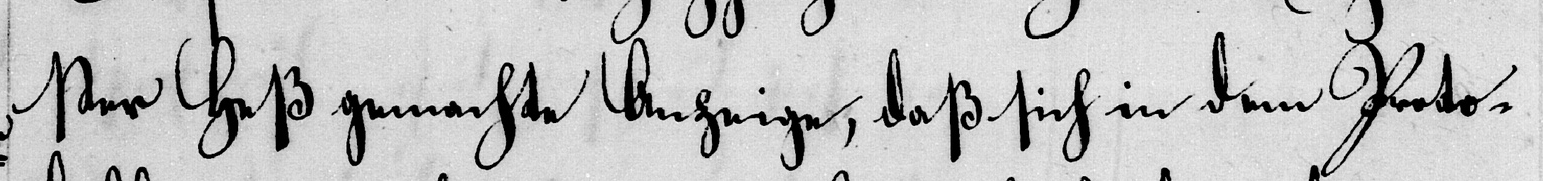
ster Heß gemachte Anzeige, daß sich in dem Proto¬
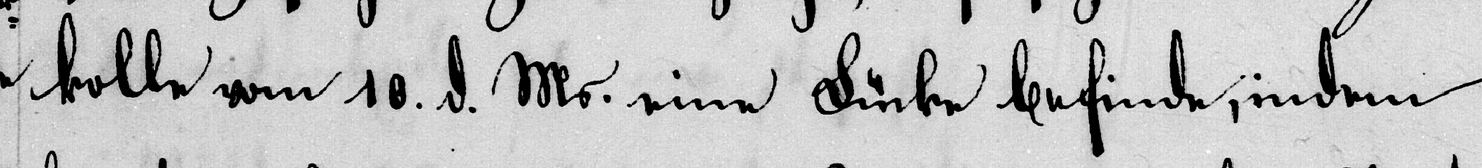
kolle vom 10 d. Ms. eine Lücke befinde, indem
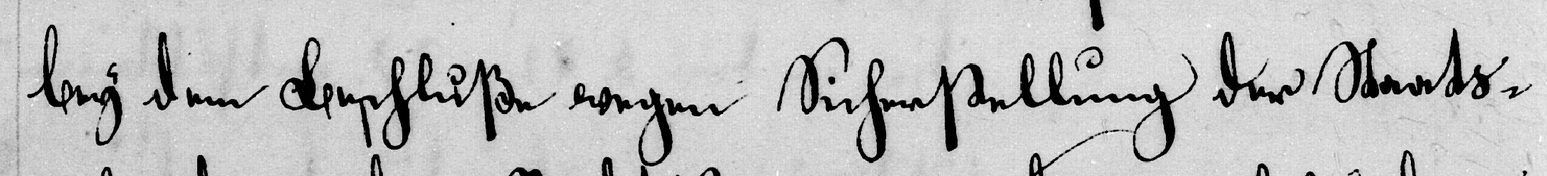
bey dem Beschluße wegen Sicherstellung der Staats¬
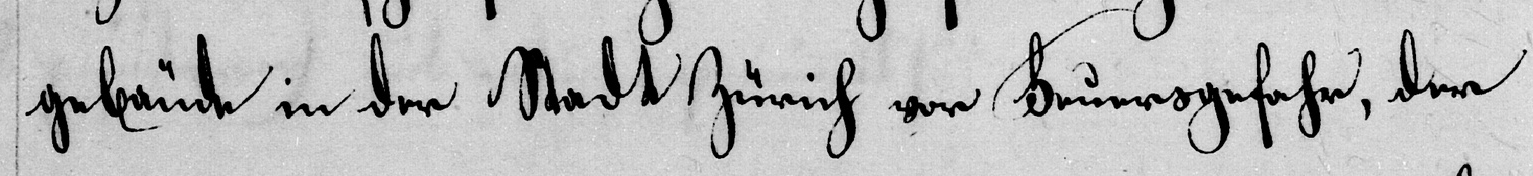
gebäude in der Stadt Zürich vor Feuersgefahr, der
